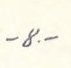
8
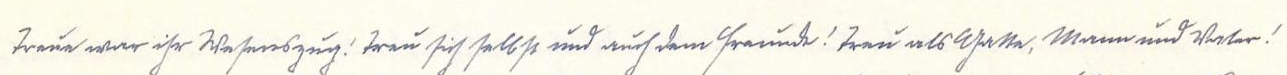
Treue war ihr Wesenszug!Treu sich selbst und auch dem Freunde! Treu als Gatte, Mann und Vater !
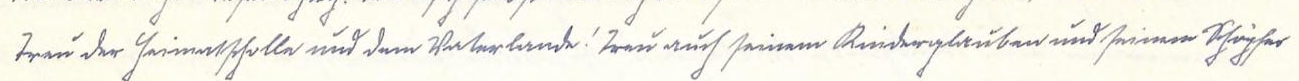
Treu der Heimatsscholle und dem Vaterland! Treu auh seinem Kinderglauben und seinem Schöpfer
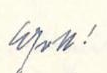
Gott!
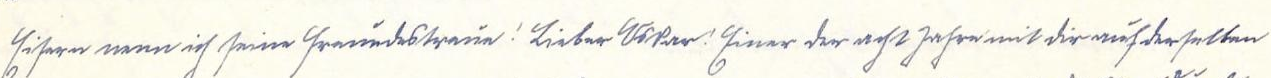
Eisern nenn ich seine Freundestreue! Lieber Oskar! Eine der acht Jahren mit dir auf derselben
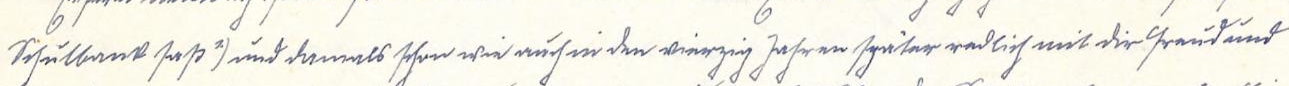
Schulbank saß 1) und damals schon wie auch in den vierzig Jahren später redlich mit ihr Freud und
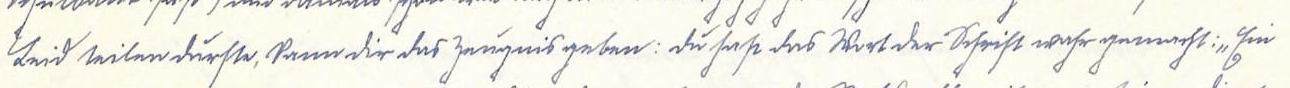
Leid teilen durfte, kann dir das Zeugnis geben: Du hast das Wort der Schrift wahrgemacht: „Ein
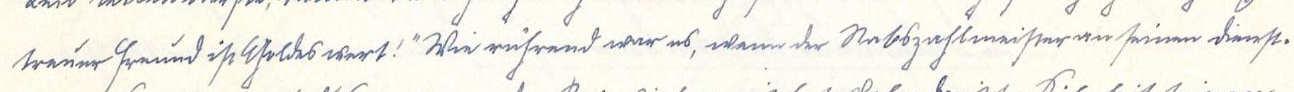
treuer Freund ist Goldes wert!“ Wie rührend war es, wenn der Stabszahlmeister an seiner dienst-
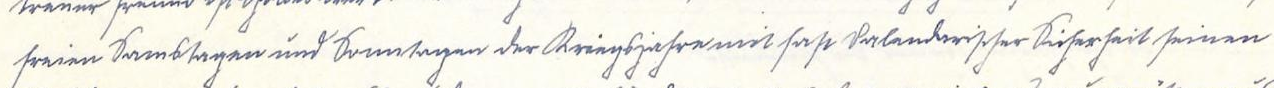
freien Samstagen und Sonntagen der Kriegsjahre mit fast kalendarischer Sicherheit seinen
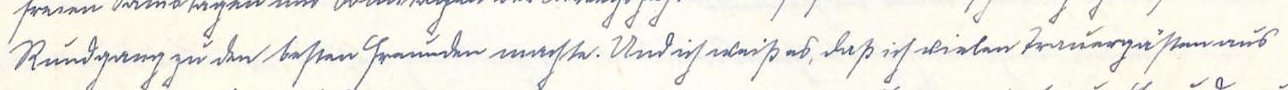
Rundgang zu den besten Freunden machte. Und ich weiß es, dass ich vielen Trauergästen aus
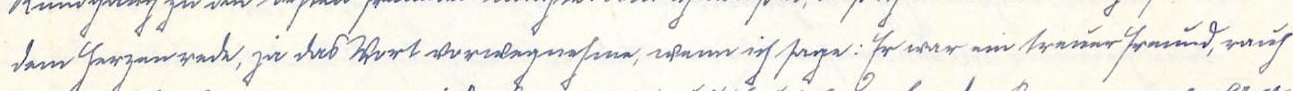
dem Herzen rede, ja das Wort vorwegnehme, wenn ich sage: Er war ein treuer Freund, rauh
